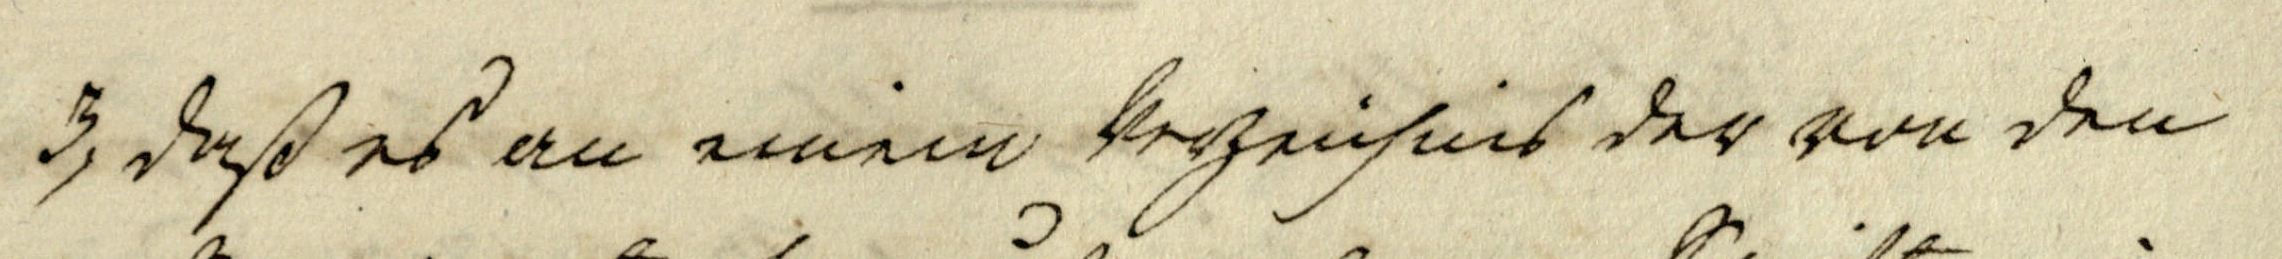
3, daß es an einem Verzeichnis der von den
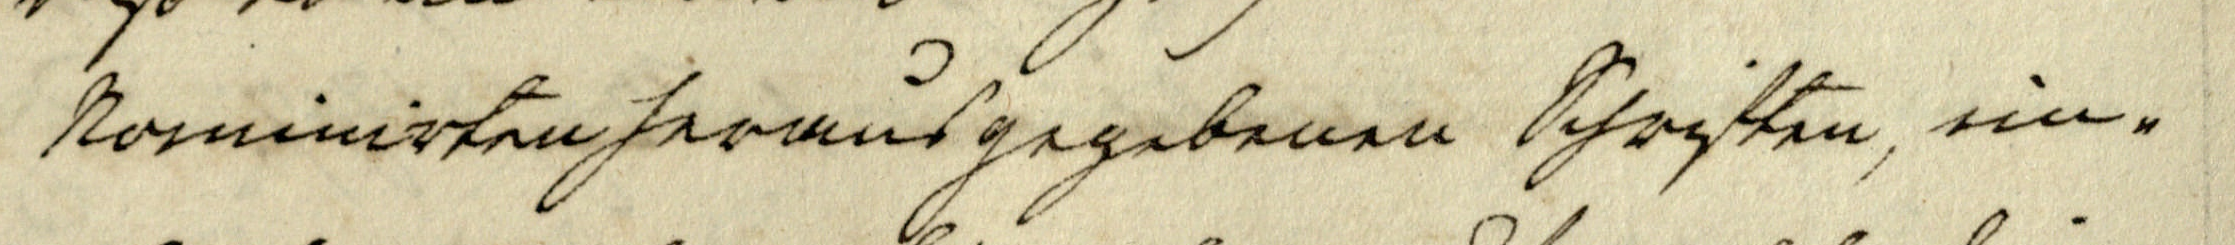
Nominirten heraus gegebenen Schriften, im¬
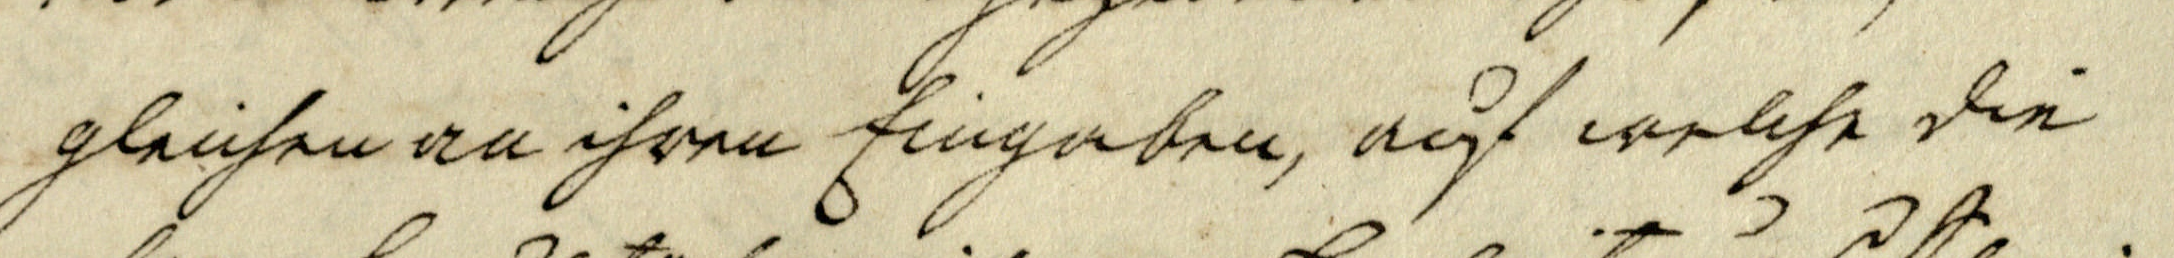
gleichen an ihren Eingaben, auf welche die
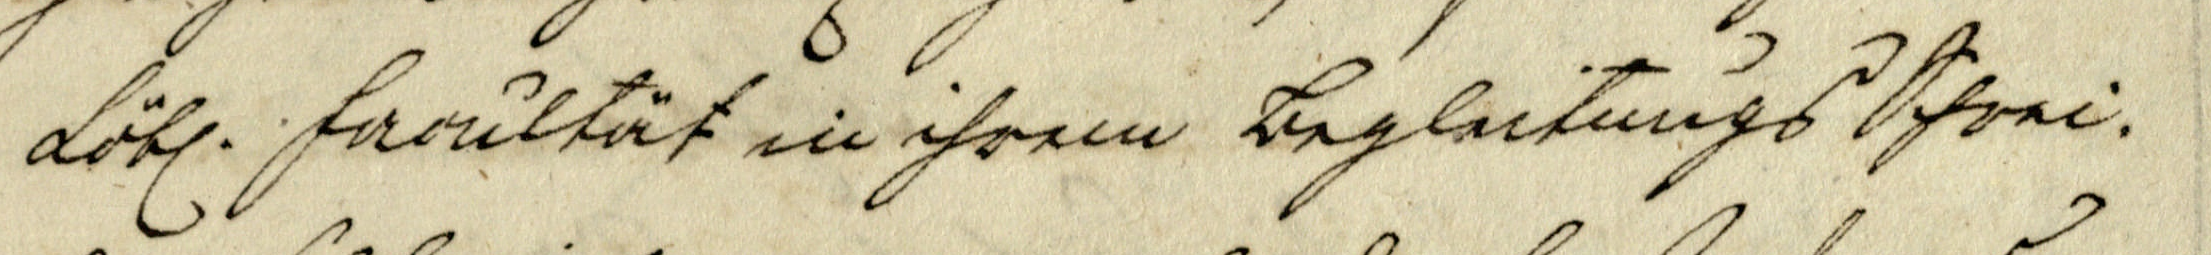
Löbl. Facultät in ihrem Begleitungs Schrei¬
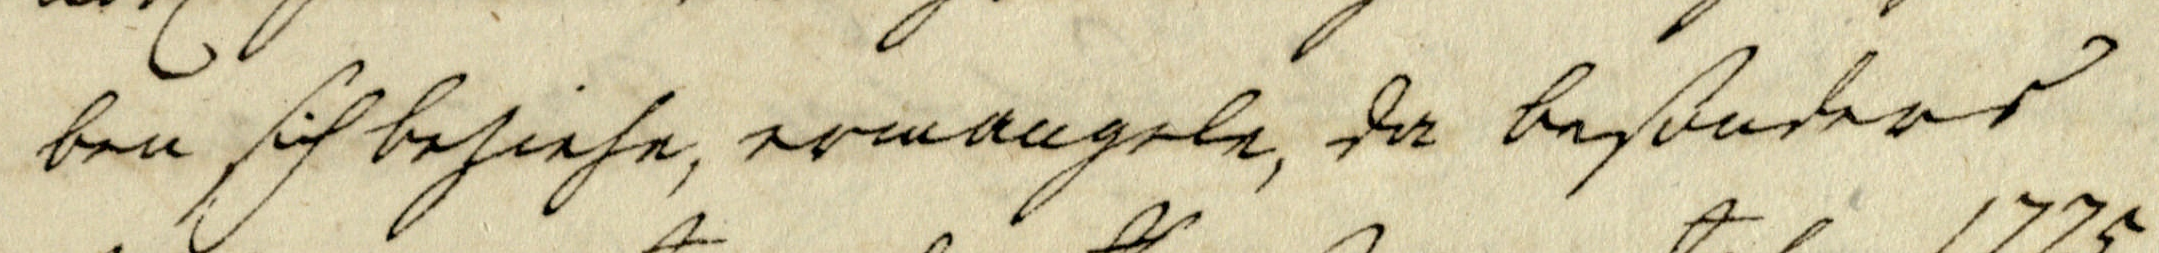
ben sich beziehe, ermangele, da besonders
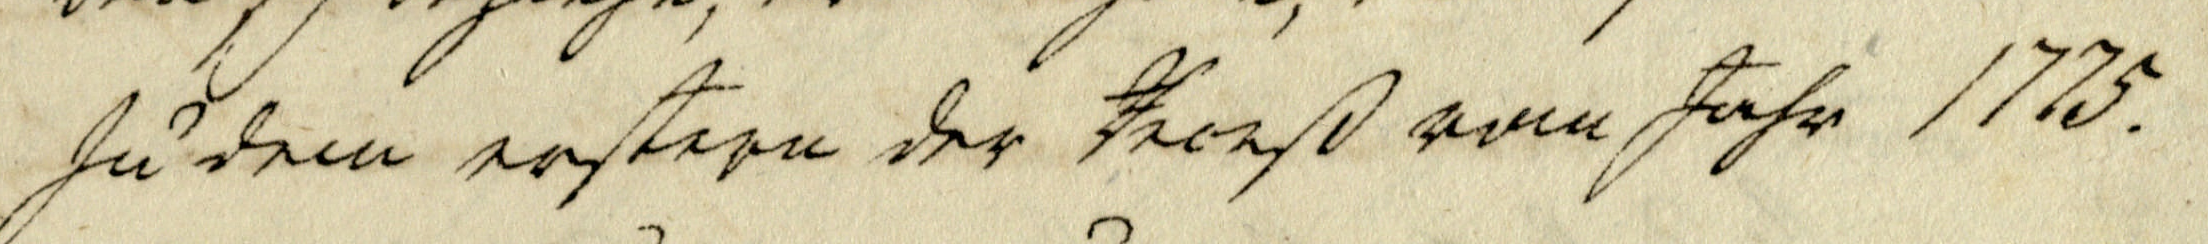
zu dem erstern der Receß vom Jahr 1775.
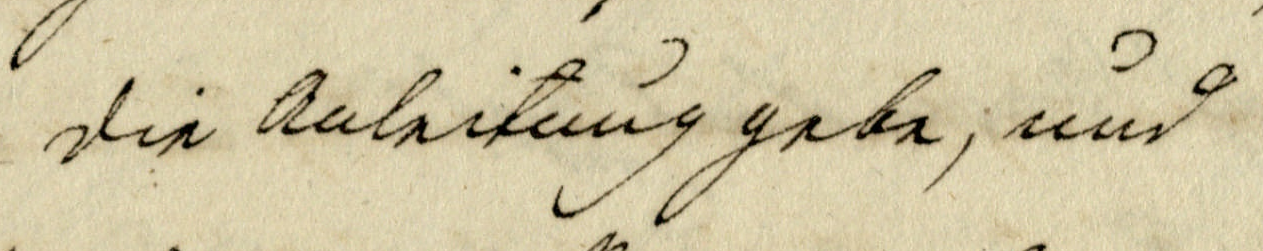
die Anleitung gebe, und
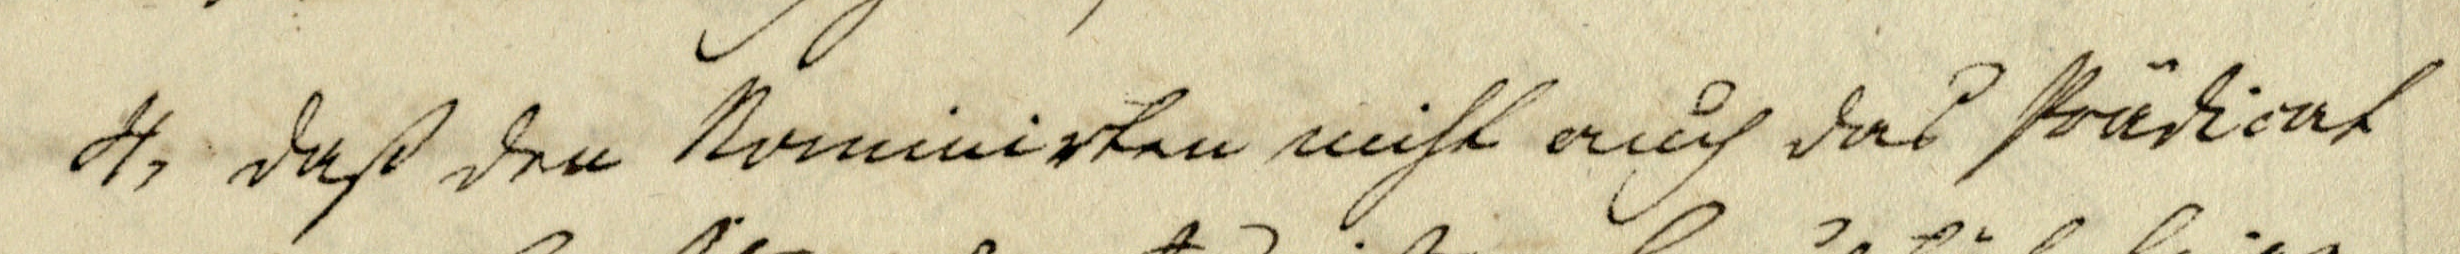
4. daß den Nominirten nicht auch das Prädicat
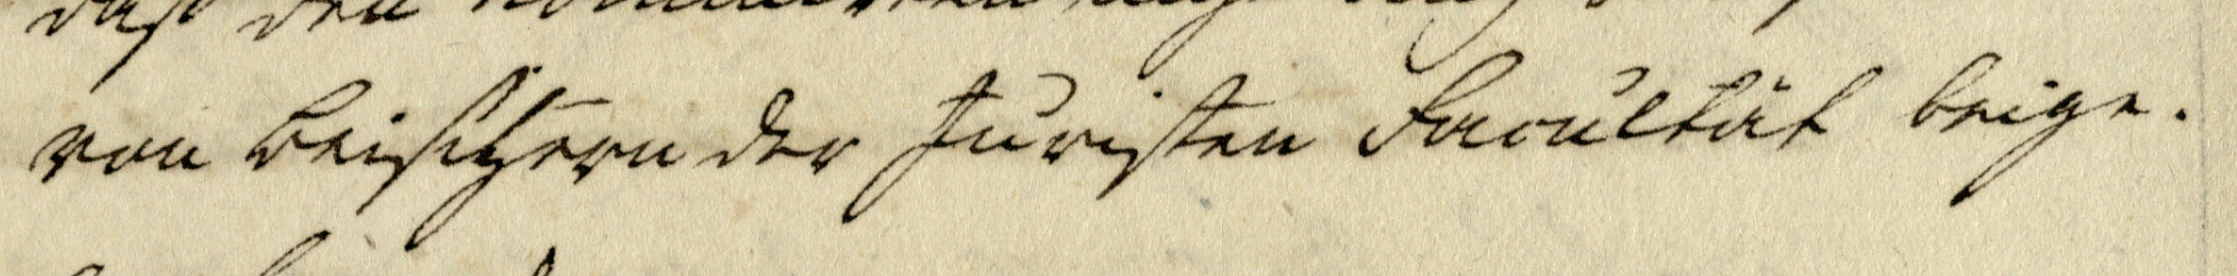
von Beisitzern der Juristen Facultät beige¬
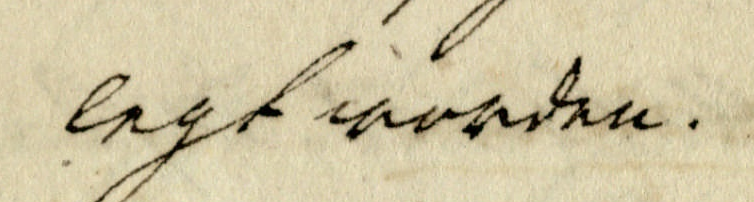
legt worden.
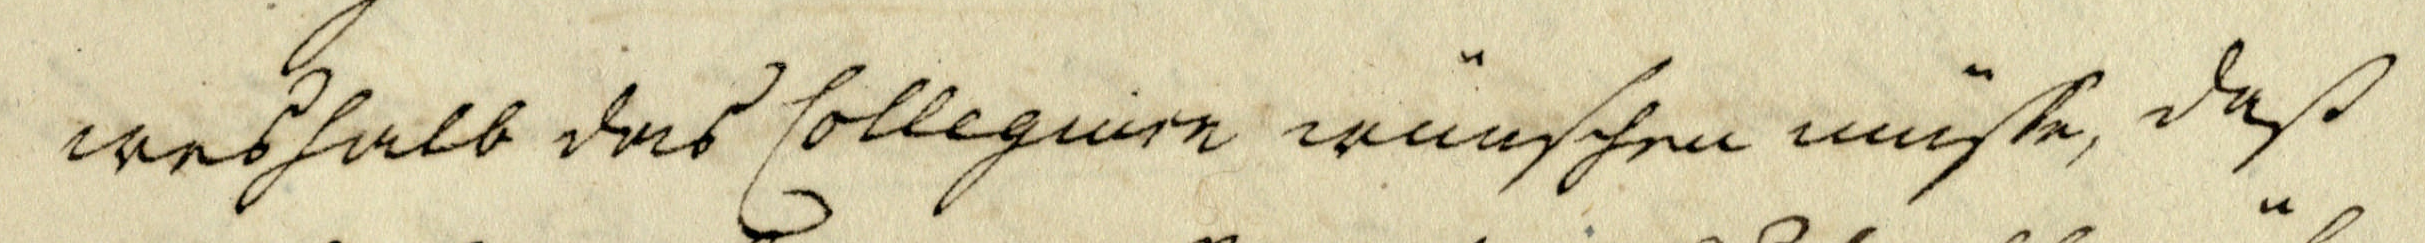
weshalb das Collegium wünschen müsse, daß
